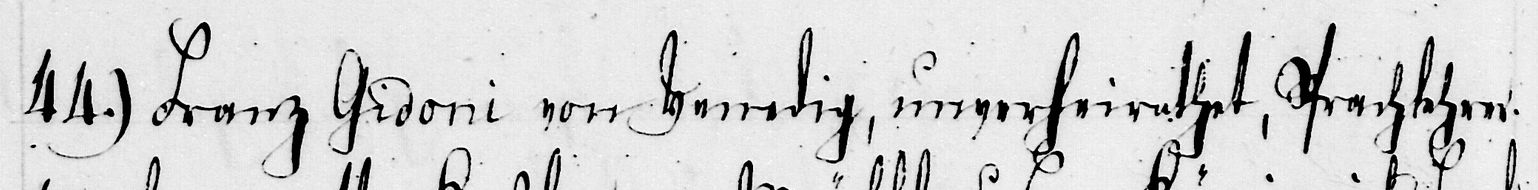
44.) Franz Gidoni von Venedig, unverheirathet, Sprachlehr¬
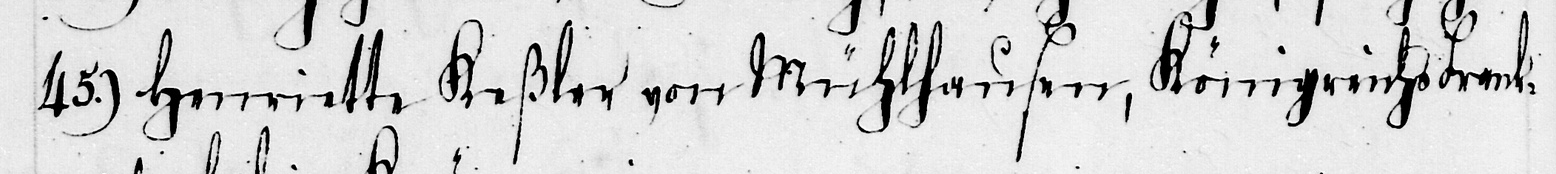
45.) Henriette Keßler von Mühlhausen, Königreichs Frank¬
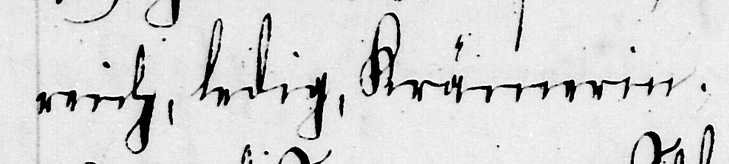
reich, ledig, Krämerin.
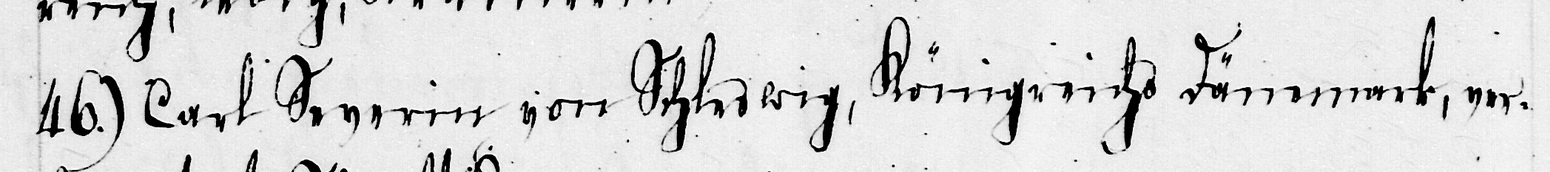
46.) Carl Severin von Schleswig, Königreichs Dänemark, ver¬
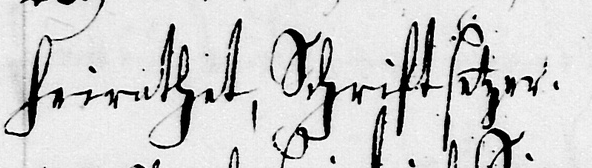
heirathet, Schriftsetzer.
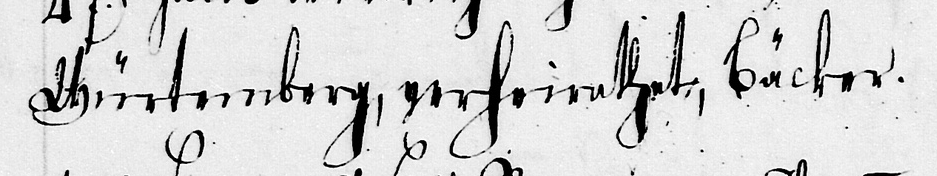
Würtemberg, verheirathet, Bäcker.
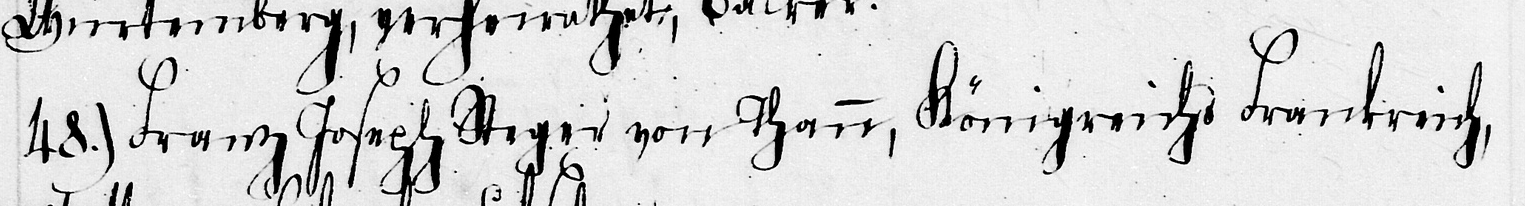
48.) Franz Joseph Steger von Thann, Königreichs Frankreich,
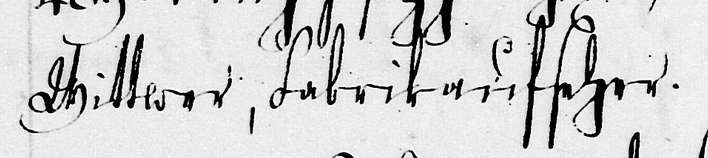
Wittwer, Fabrikaufseher.
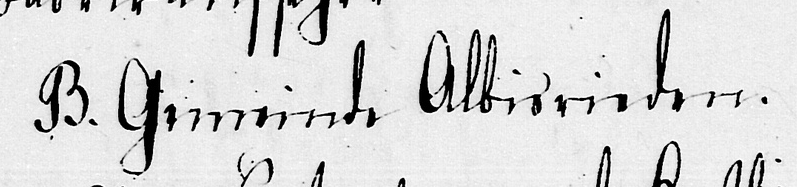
B. Gemeinde Albisrieden.
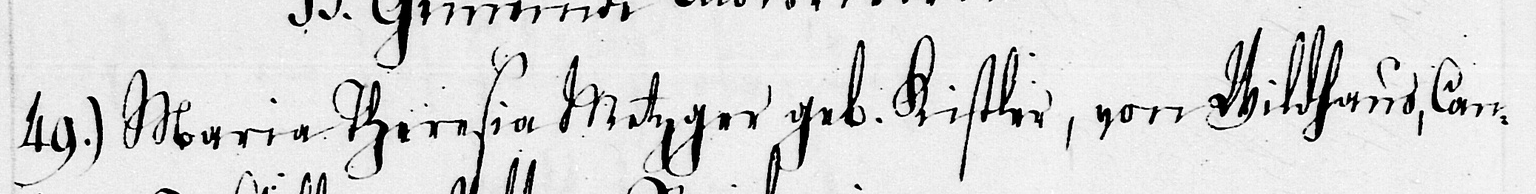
49.) Maria Theresia Metzger geb. Kistler, von Wildhaus, Can¬
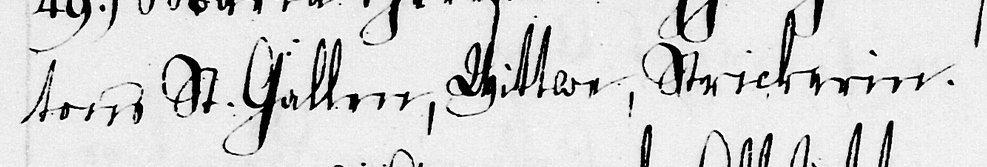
tons St. Gallen, Wittwe, Strickerin.
